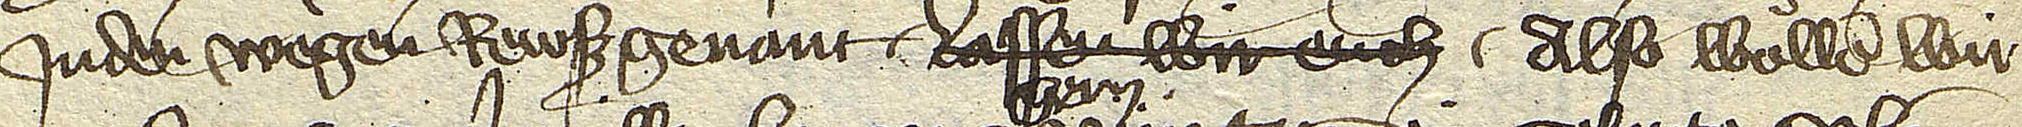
Iuden wegen Rewſʒ genant / laſſen wir euch / Alſo wölle* wir
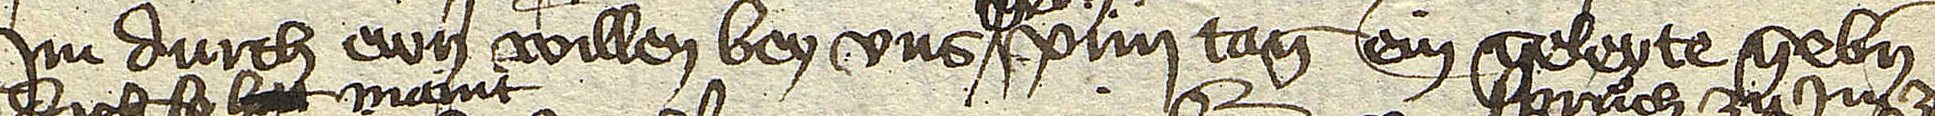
Im durch ewn* willen bey vns xiiii tag ein geleyte gebn*
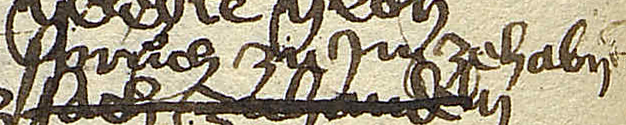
ſprüch cʒu Im cʒehabn*
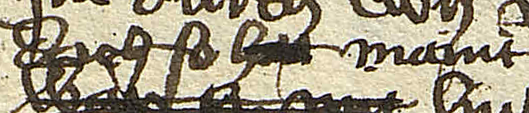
doch ſo hat maint
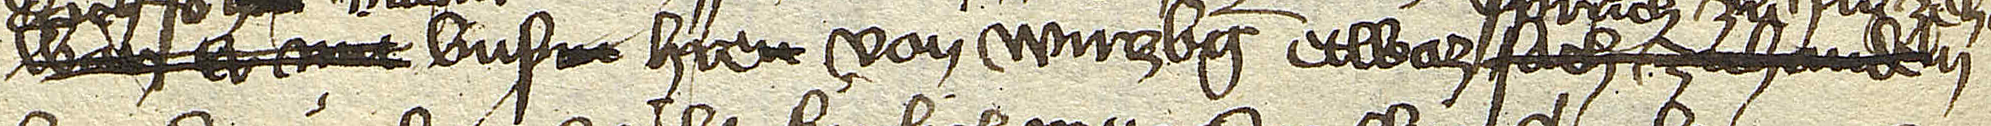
wan Er mit vnſ*m hr*en von wircʒb*g etwaʒ ſach cʒuhandeln
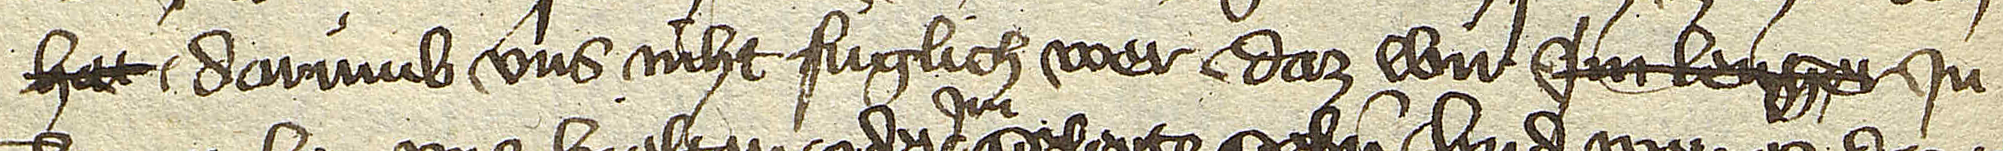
hat / darümb vns niht füglich wer / daʒ wir Im lenger In
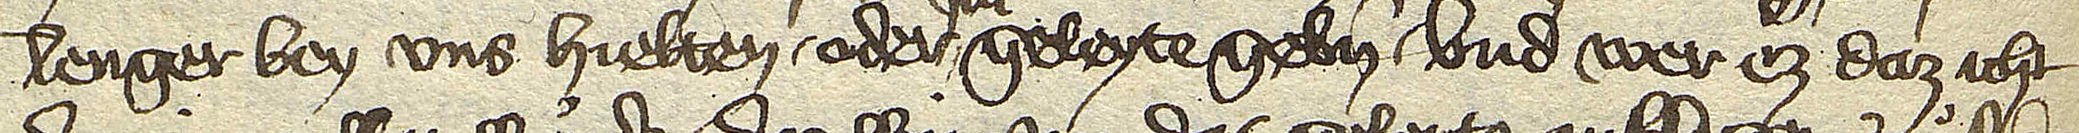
lenger bey vns hielten / oder geleyte gebn* / vnd wer eʒ daʒ icht
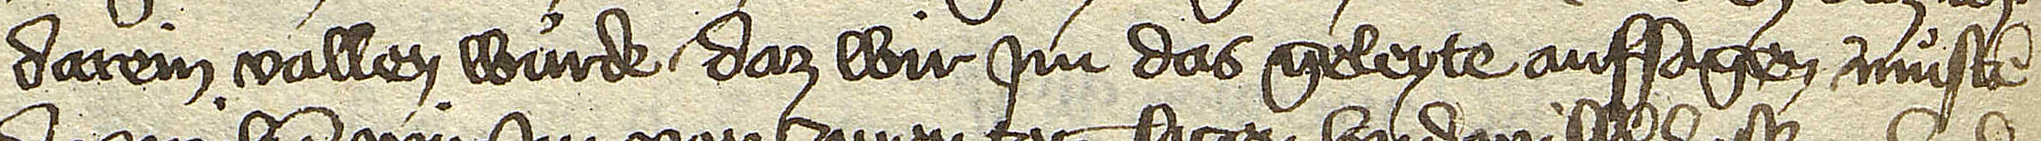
darein vallen würde / daʒ wir Im das geleyte aufſlagen müſte*
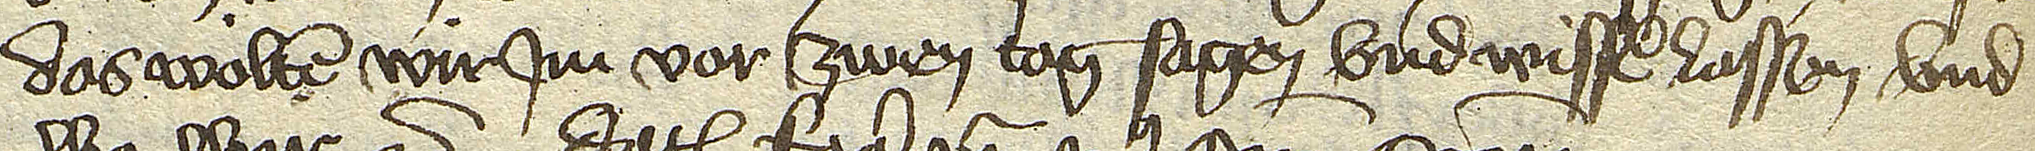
das wölte* wir Im vor cʒwey tag ſagen vnd wiſſe* laſſen / vnd
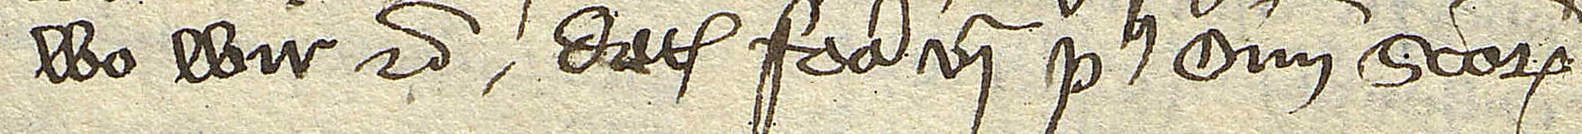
wo wir ec* / dat* fea* vi* p* Omi* Sco*
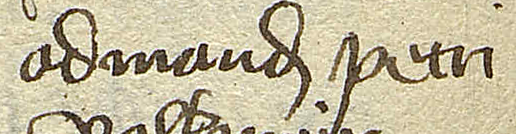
admand* Petri
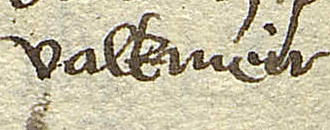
Volkmeir
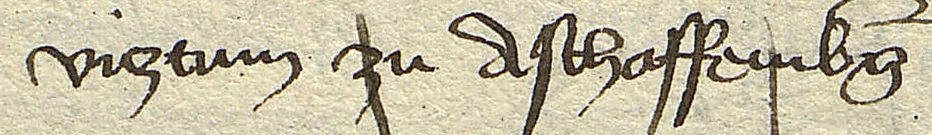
vicʒtum cʒu Aſchaffemb*g
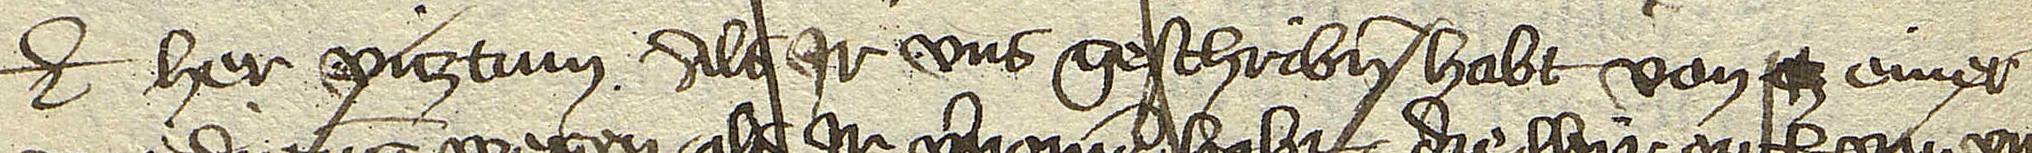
L* her vicʒtum / Als Ir vns geſchribn* habt von cʒ einer
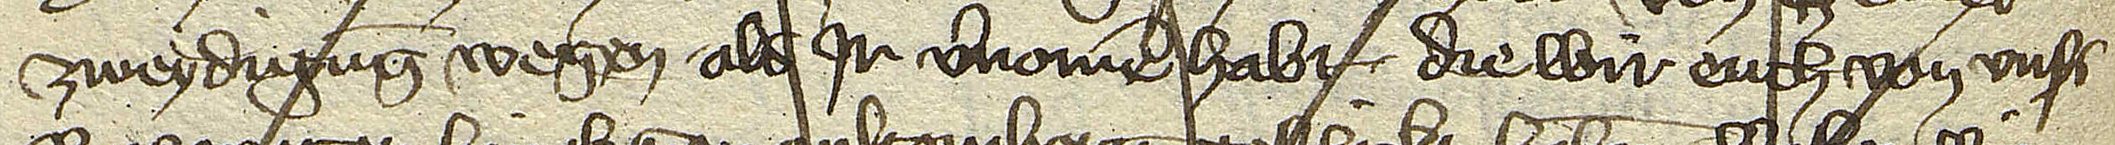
cʒweydigug* wegen / als Ir v*nome* habt / die wir euch von vnſ*s
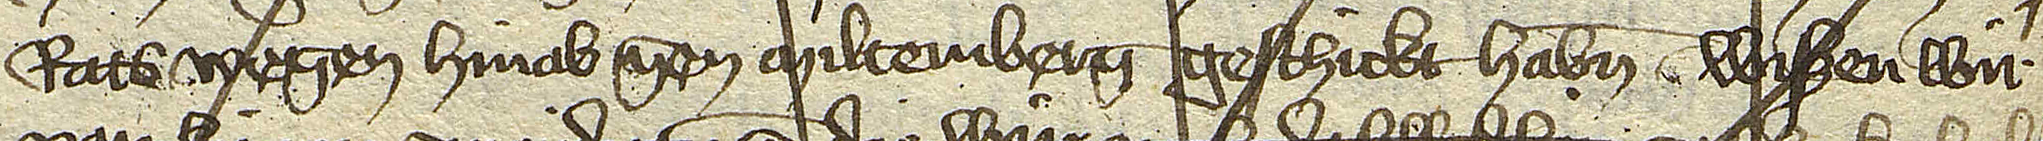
Rats wegen hinab gen Miltemberg geſchickt habn* / wiſʒen wir
